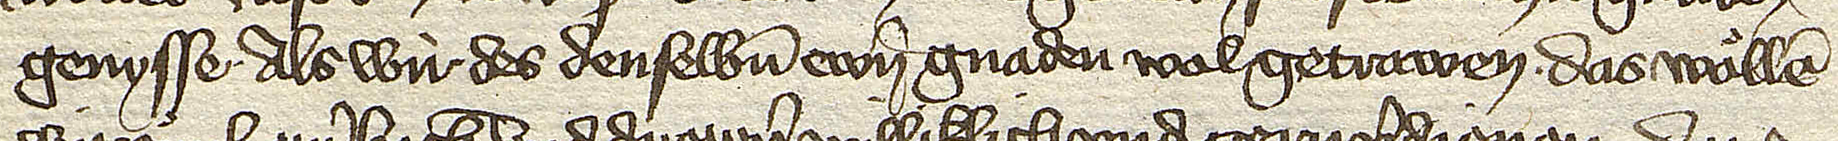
genyſſe . Als wir des denſelbn* ew*n gnaden wol getrawen . Das wölle*
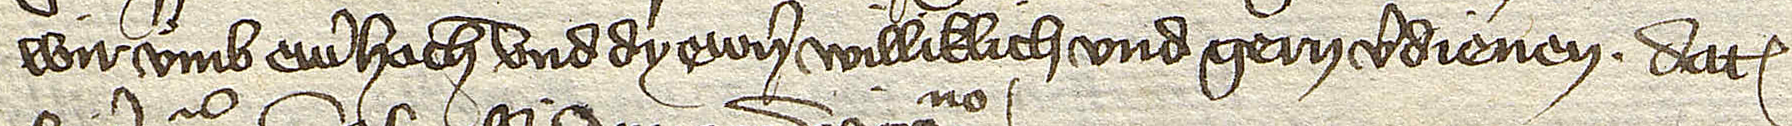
wir v̈mb ew* hoch* vnd dy ew*n williklich vnd gern v*dienen . Dat*
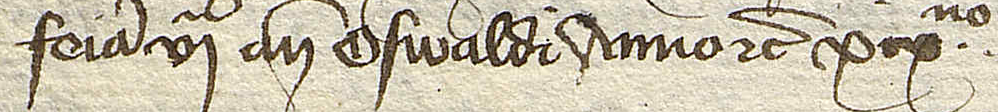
feia* vi* an* Oſwaldi Anno ec* xix* .
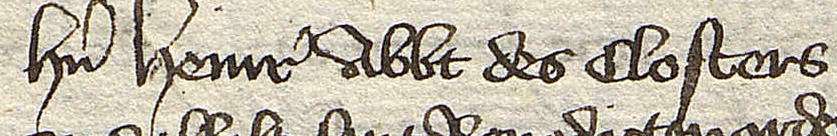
hn* Heinr* Abbt des Cloſters
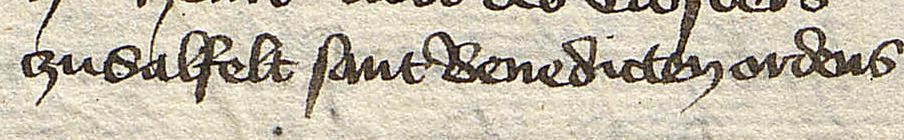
cʒu Salfelt ſant Benedicten ordens
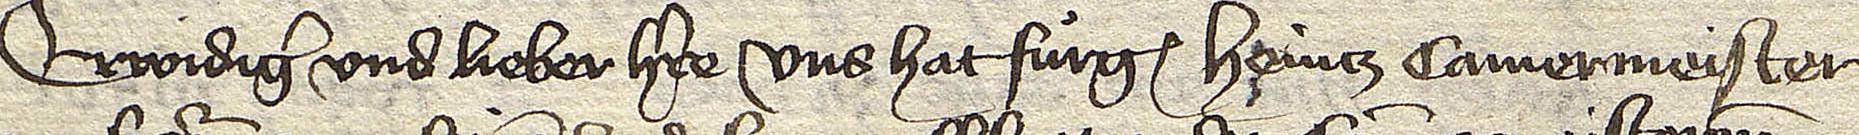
Erwidig* vnd lieber h*re vns hat fürg* heincʒ Camermeiſter
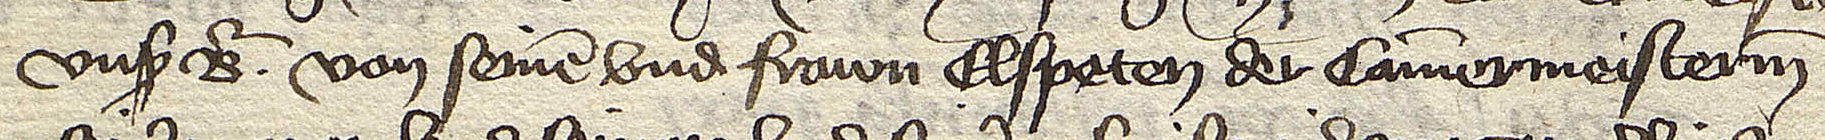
vnſ* B* . von ſeine* vnd frawn Elſpeten der Cam*ermeiſterin
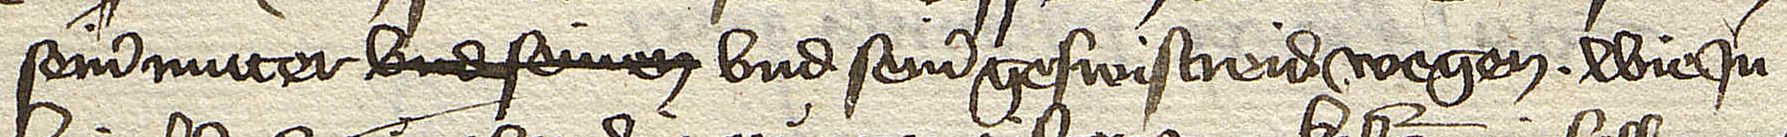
ſein* muter vnd ſeinen vnd ſein* geſwiſtreid* wegen . wie In
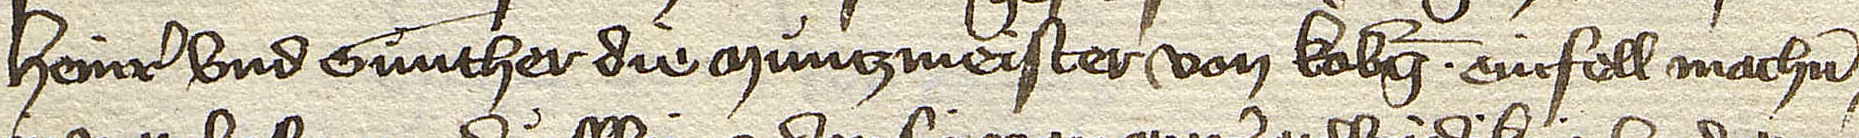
heinr* vnd Günther die Müncʒmeiſter von kob*g . einfell machn*
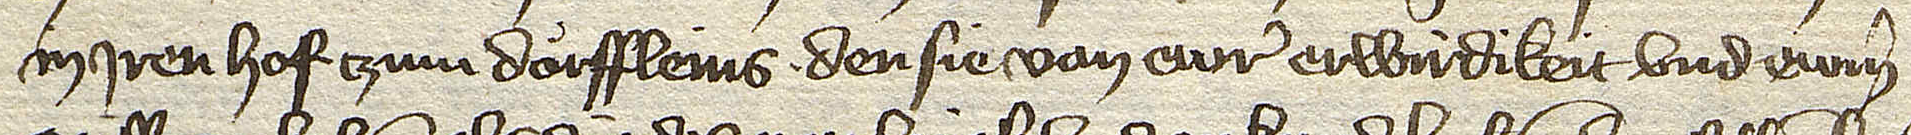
in Iren hof cʒum dörffleins . den ſie von ewr* erwirdikeit vnd ew*m
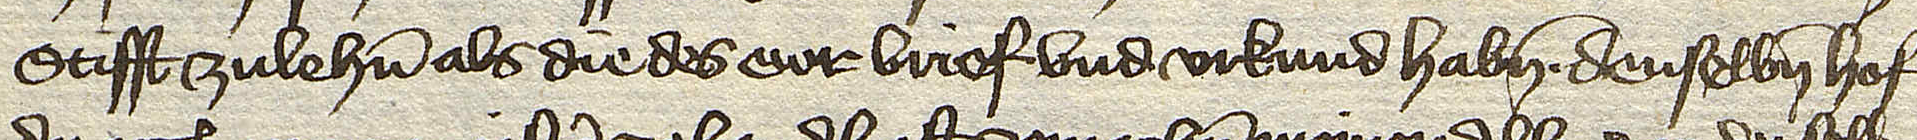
Stifft cʒulehn* als die des ewr brief vnd vrkund habn* denſelbn* hof
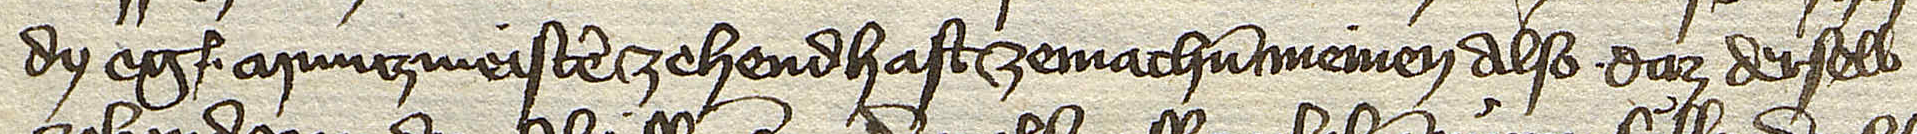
dy eg* . Muncʒmeiſte* cʒehendhaft cʒemachn* meinen Alſo . daʒ derſelb
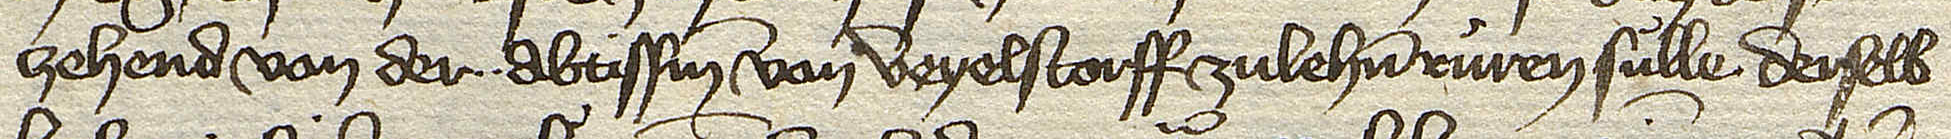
cʒehend von der ~ Abtiſſin* von Veyelſtorff cʒulehn* rüren ſülle . derſelb
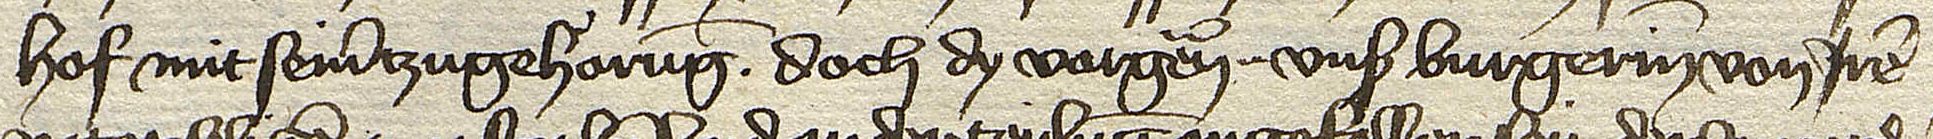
hof mit ſein* cʒugehöru*g . doch dy vorgen* ~ vnſ* burgerin* von Ire*
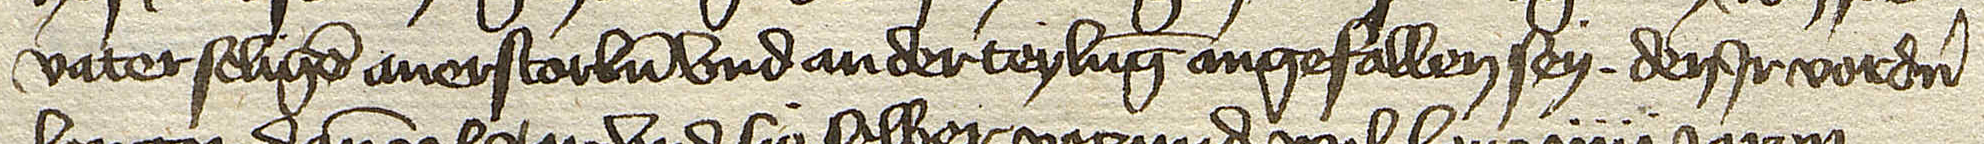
vater ſelige* anerſtorbn* vnd an der teylu*g angefallen ſey . den Ir vordn*
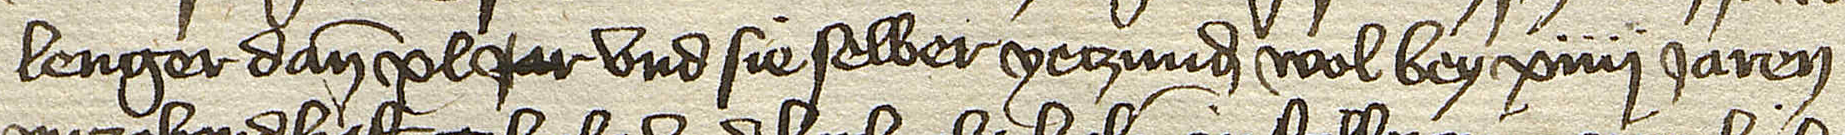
lenger dan* xl Iar vnd ſie ſelber yecʒund* wol bey xiiii Iaren
